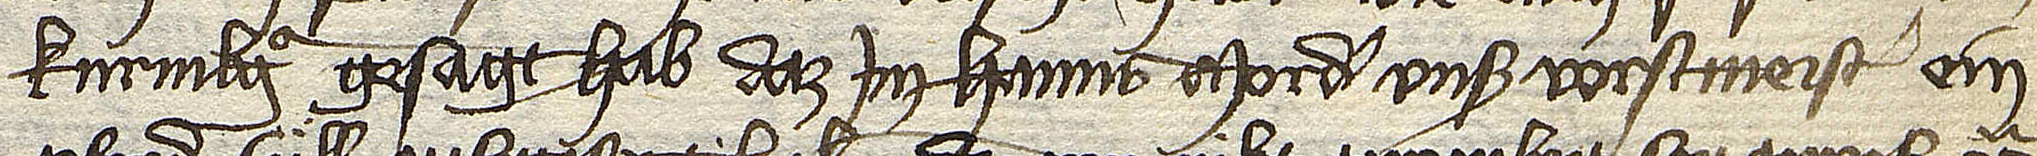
kurmb*g geſagt hab daʒ Im hanns Mord* vnſ* vorſtmeiſt* ein
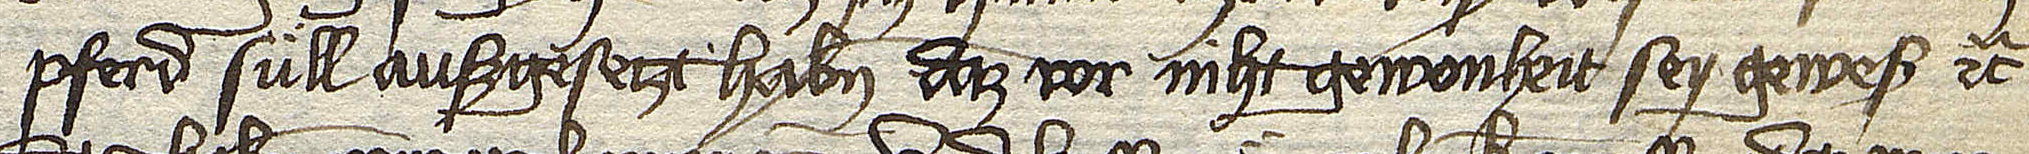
pferd ſüll auſʒgeſecʒt habn* das vor niht gewonheit ſey geweſ* ec*
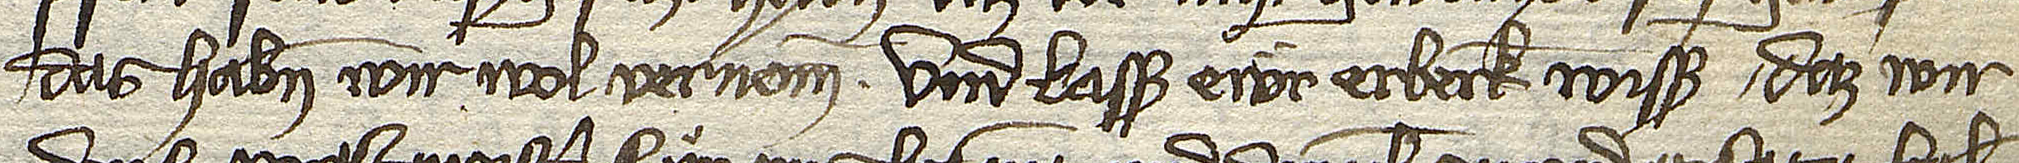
das habn* wir wol vernom* . vnd laſſ* eẅr erberk* wiſſ* / daʒ wir
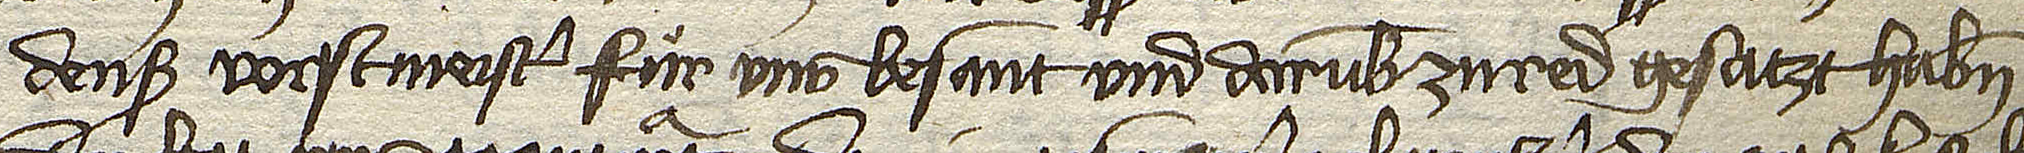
denſ* vorſtmeiſt* für vns beſant vnd darub* ʒu red geſacʒt habn*
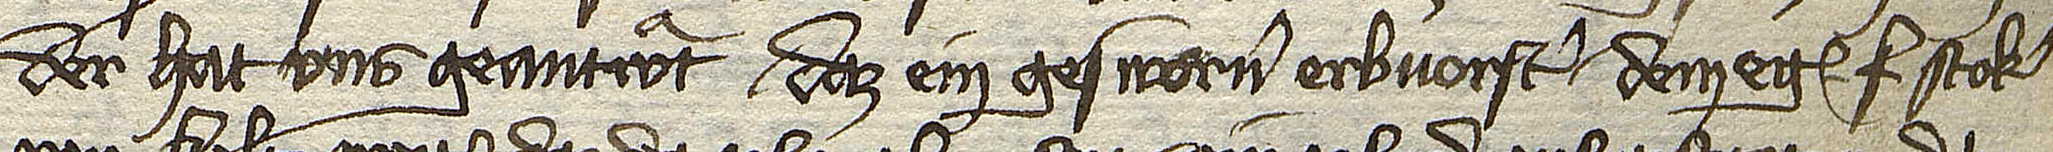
Der hat vns geantw*t / Daʒ ein geſworn* erbuorſt* / dem eg* . F ſtok*
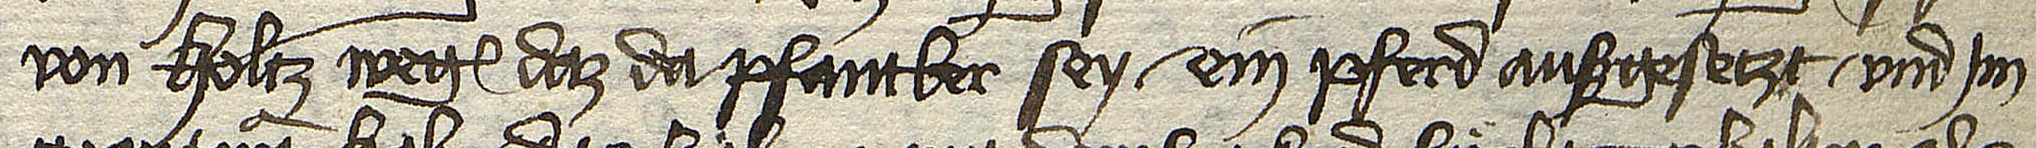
von Holcʒ weg* daʒ da pfantber ſey / ein pferd auſʒgeſecʒt / vnd Im
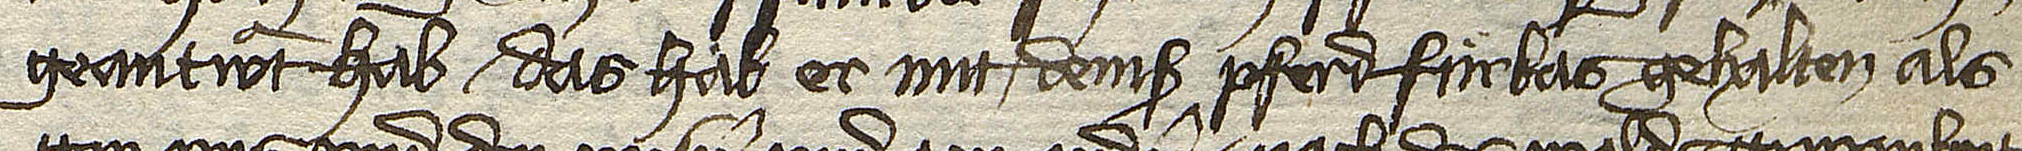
geantw*t hab / das hab er mit / demſ* pferd fürbas gehalten als
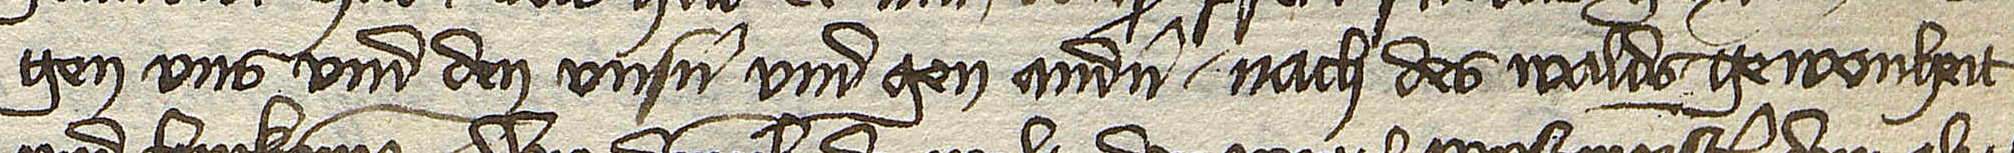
gen vns vnd den vnſn* vnd gen andn* / nach des walds gewonheit
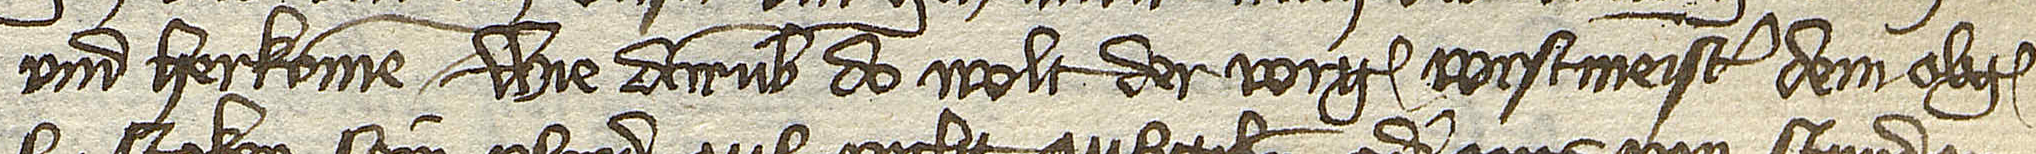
vnd herkome* / Wie darub* do wolt der vorg* vorſtmeiſt* dem obg*
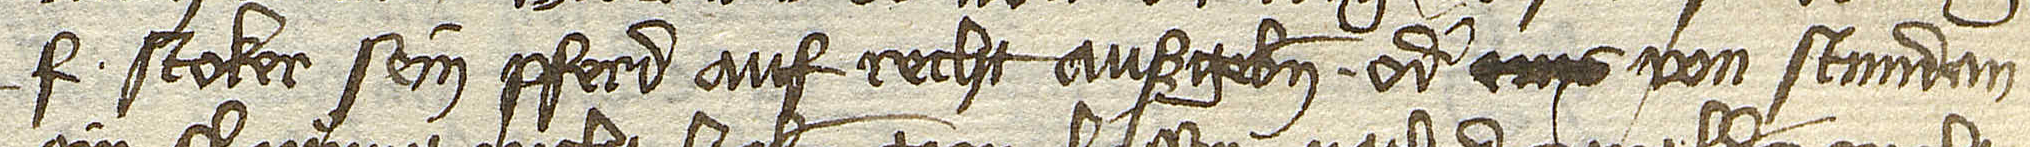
f . ſtoker ſein pferd auf recht auſʒgebn* . od* eins von ſtundan
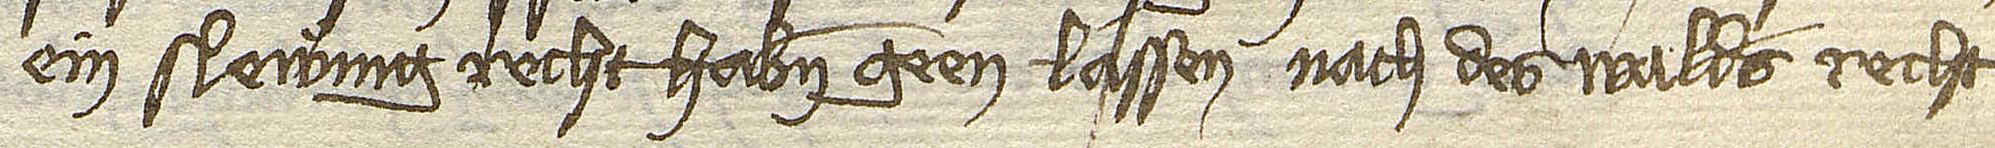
ein ſleẅnig recht habn* geen laſſen nach des walds recht
